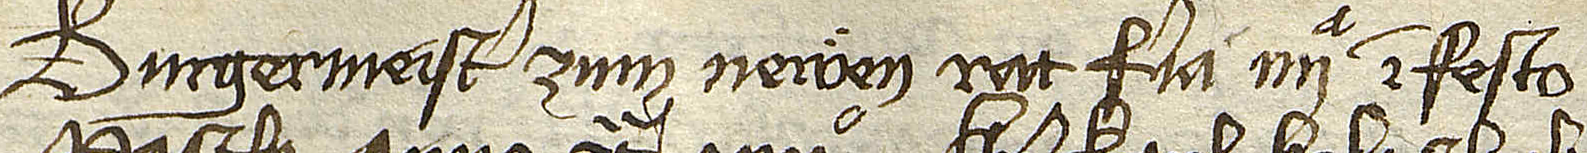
Burgermeiſt* cʒum neẅen rat fia* iiii* i* feſto
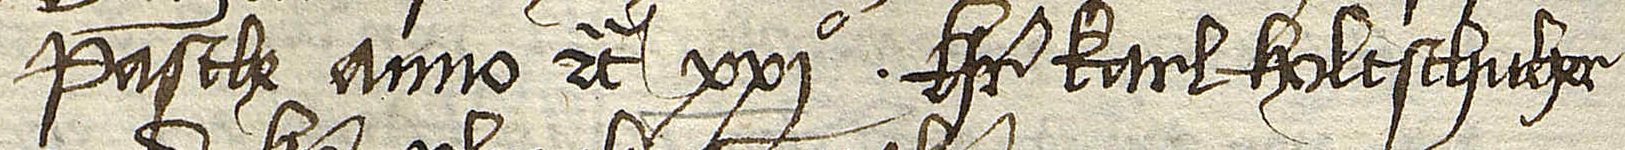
Paſche Anno ec* xxi* . hr* karl holtſchuher
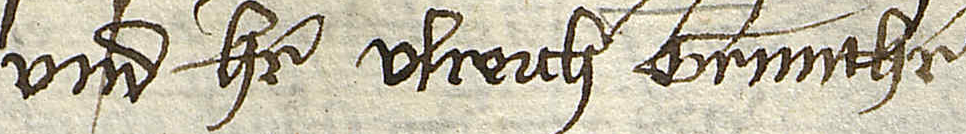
vnd hr* vlreich Grunthr*
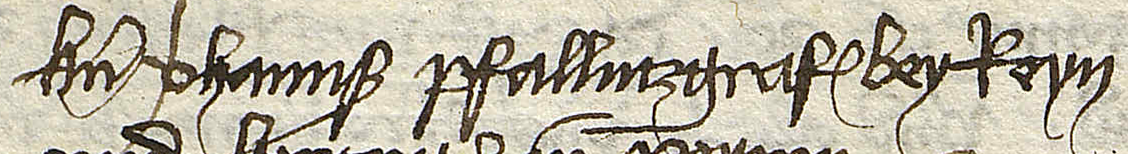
hn* Iohannſ* pfallncʒgraf* bey Reyn
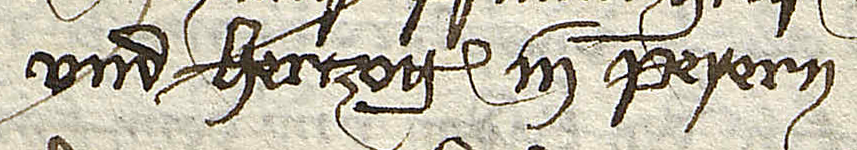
vnd hercʒog* in Peyern
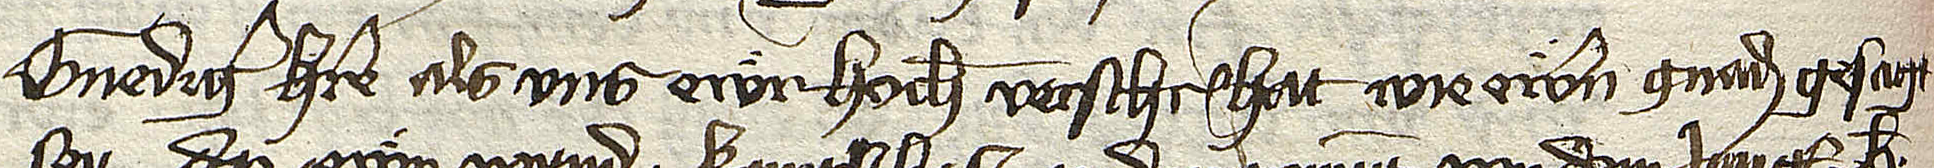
Gnedig* hr*e Als vns ewr hoch* verſchr* hat wie ew*n gnad* geſagt
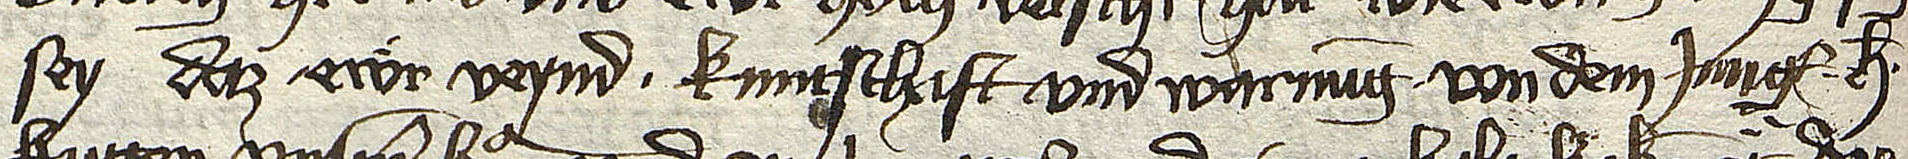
ſey daʒ ewr veynd . kuntſchaft vnd warnug* vin den Iung* . h*.
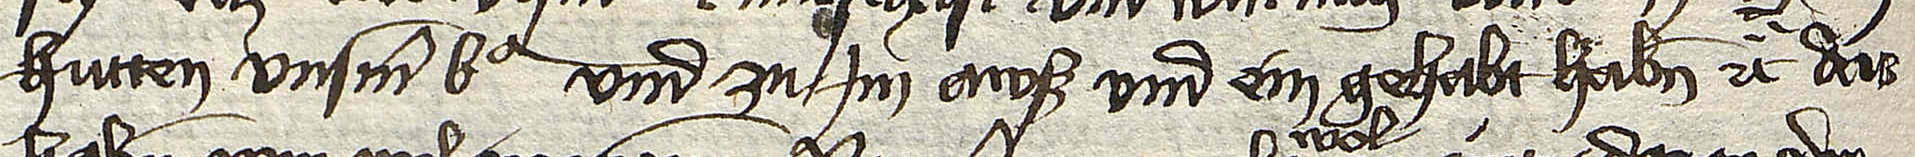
hutten vnſm* b* vnd ʒu Im awſʒ vnd ein gehabt habn* ec* das
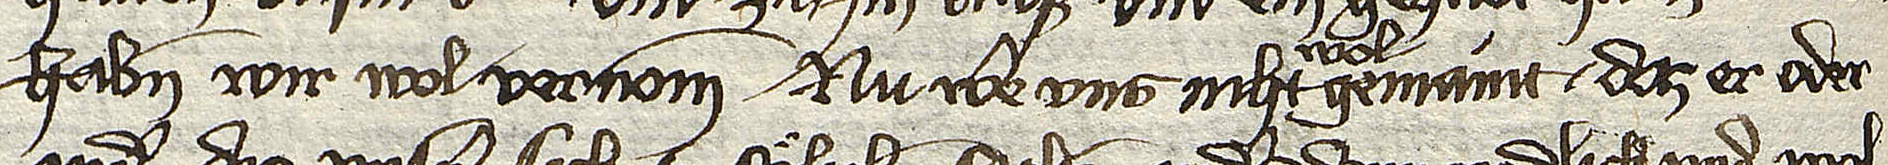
habn* wir wol vernom* / Nu w*e vns niht gemaint / daʒ er oder
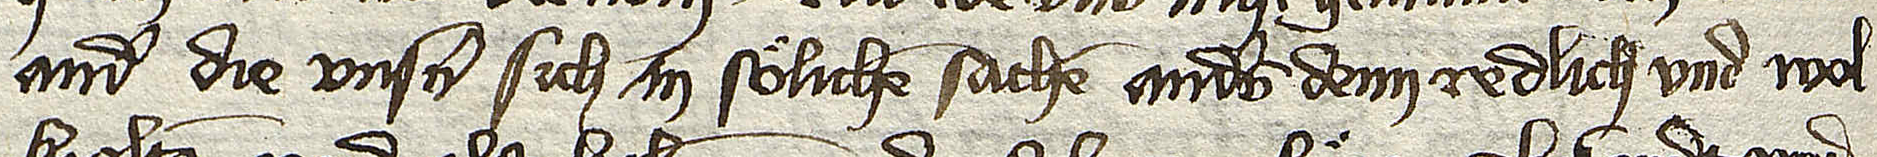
and* die vnſn* ſich in ſöliche* ſache* and*s denn redlich vnd wol
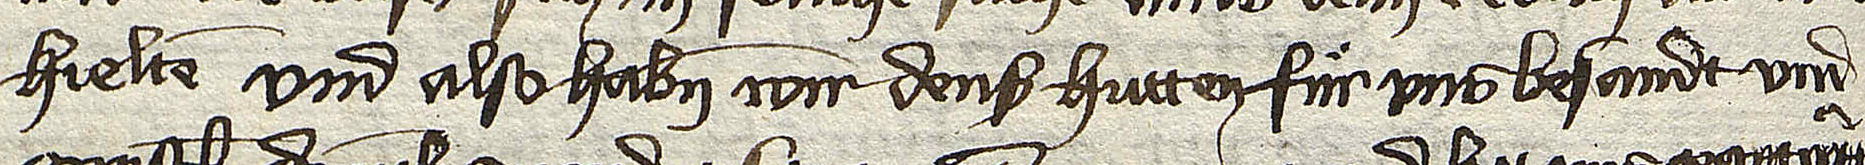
hielte* vnd alſo habn* wir denſ* hutten für vns beſandt vnd
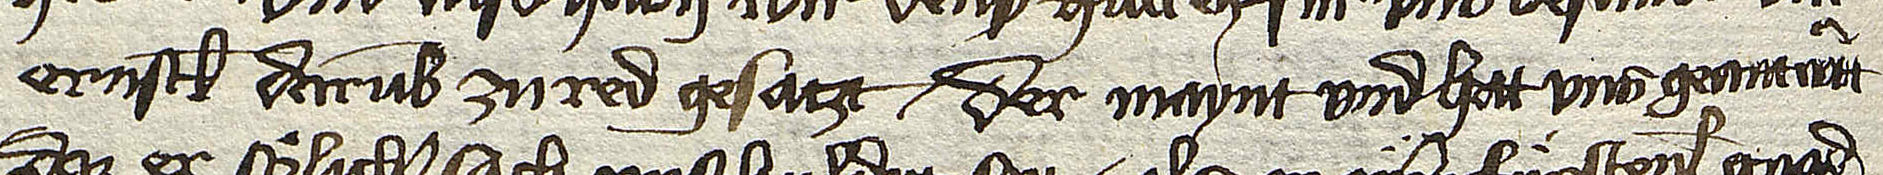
ernſtl* darub* cʒ red geſacʒt / Der maynt vnd hat vns geantwt*
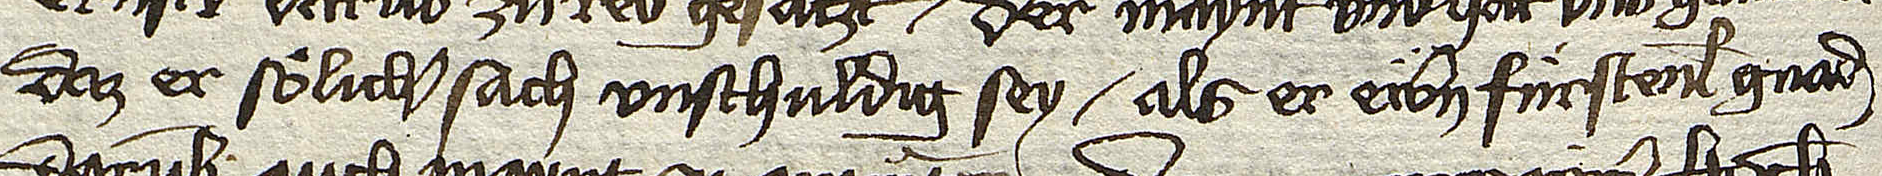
daʒ er ſölich* ſach vnſchuldig ſey / als er ew*n fürſtenl* gnad*
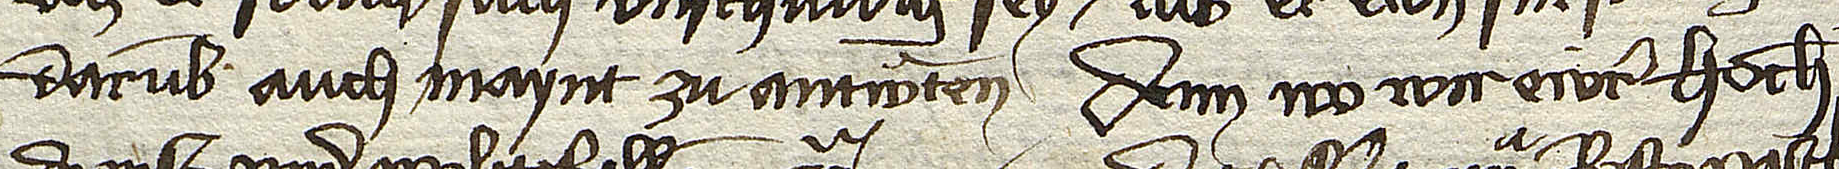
darub* auch maynt ʒu antwten* Denn wo wir ewr* hoch*
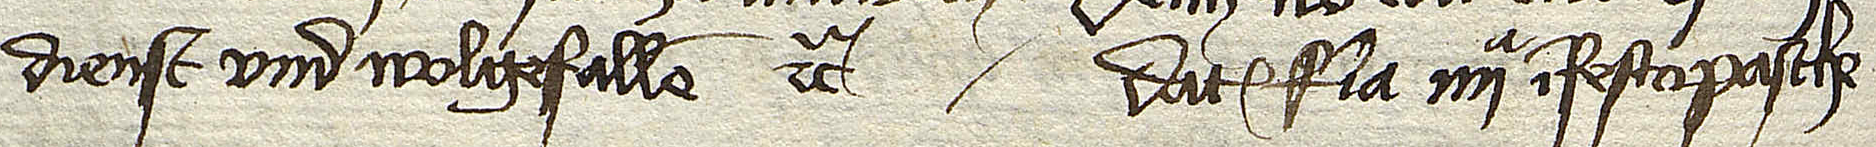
dienſt vnd wolgefalle* ec* / dat* fia* iiii* i* feſto Paſche
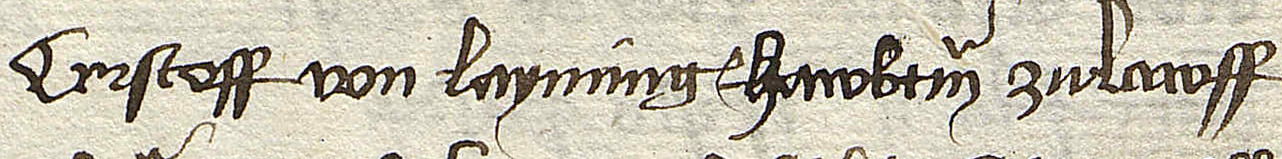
Criſtoff von layming* hawbtm* cʒu Lawff
